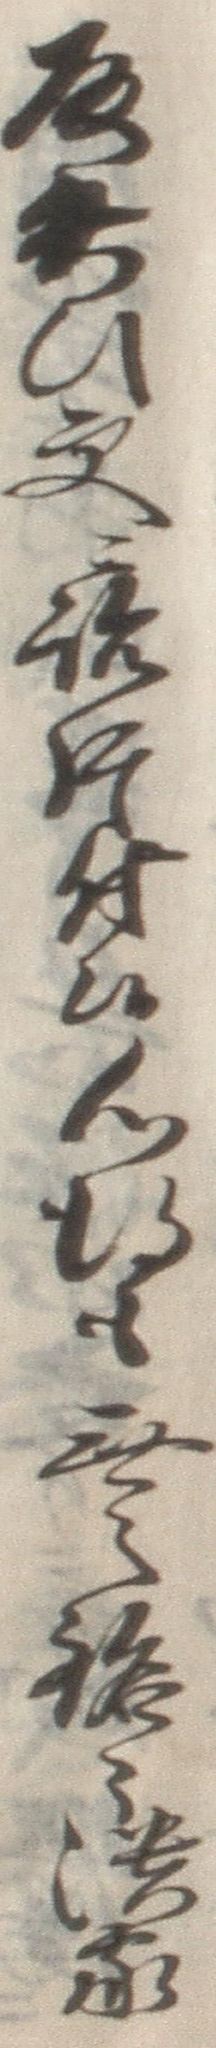取失ひ更二跡片付候心得も無之銘々潰家
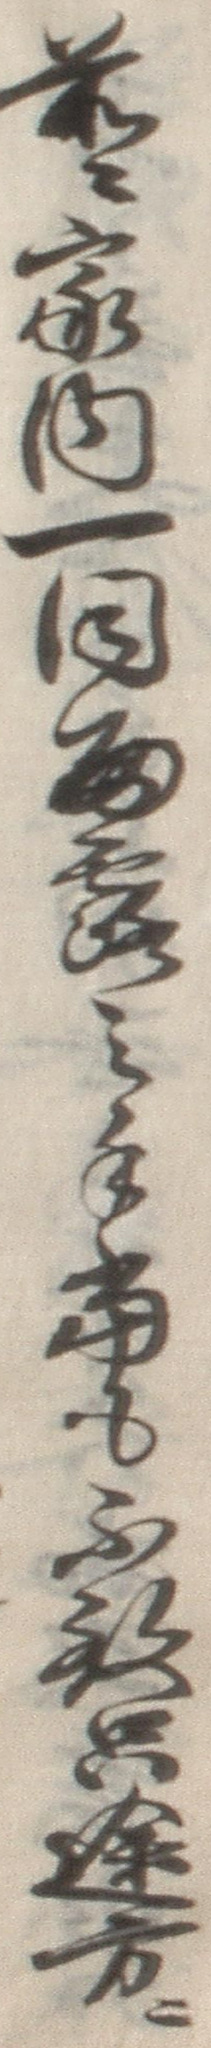前二家内一同雨露之手当も不致只途方二
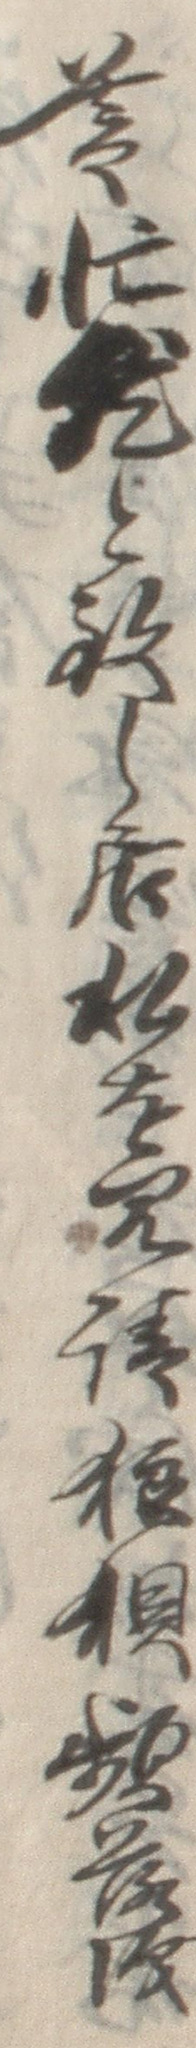暮茫然と致し居私を見請狼狽頻落涙
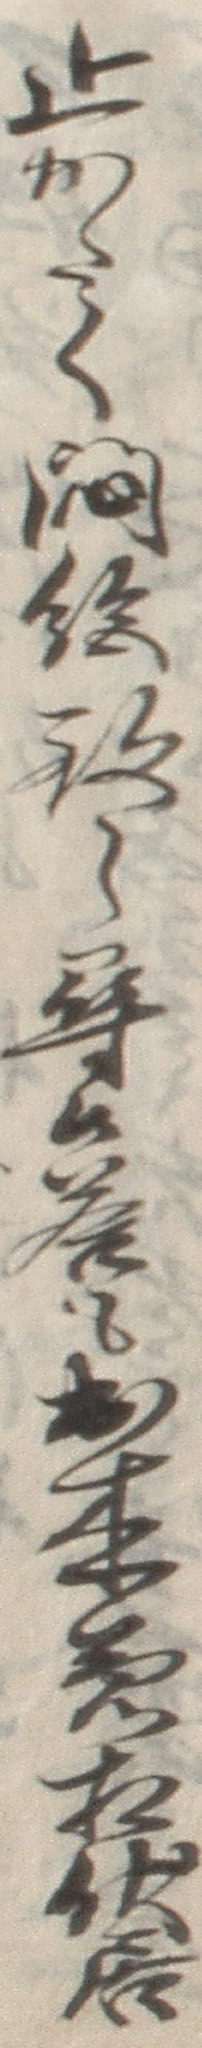止かたく悶絶致し尋候答も出来兼相伏居
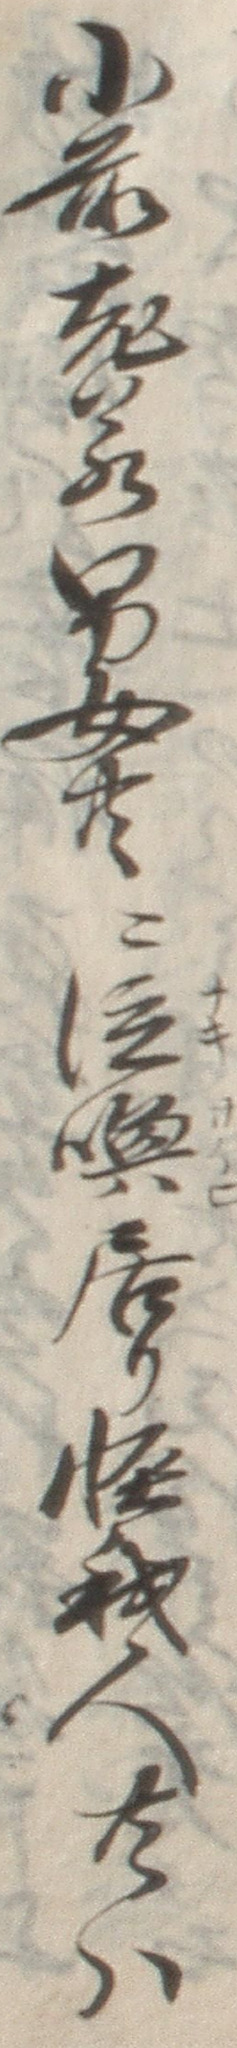小前老若男女共二泣喚居り怪我人共ハ

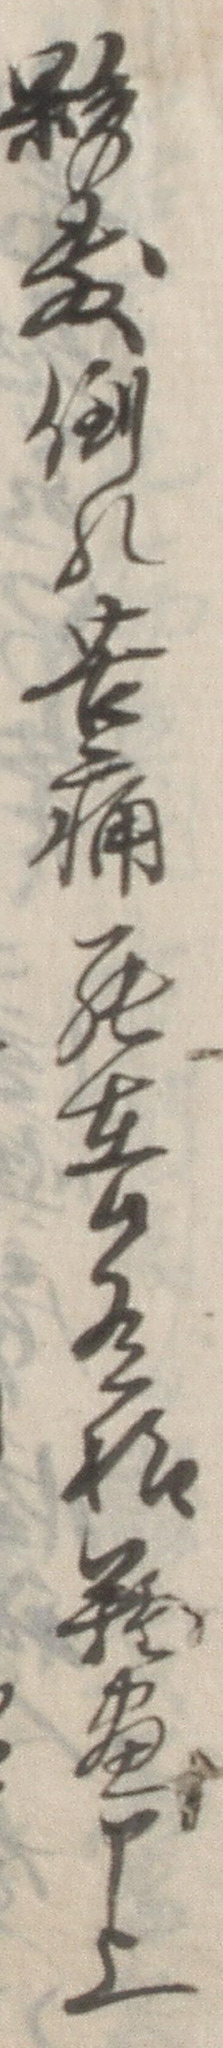夥敷倒れ苦痛罷在候有様難盡申上
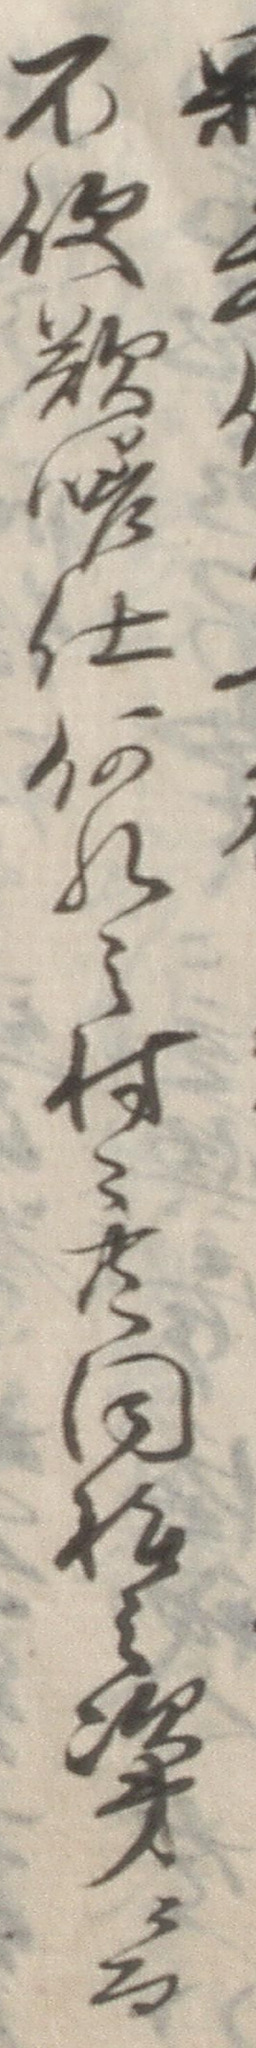不便歎嗟仕何れ之村々共同様之次第二而
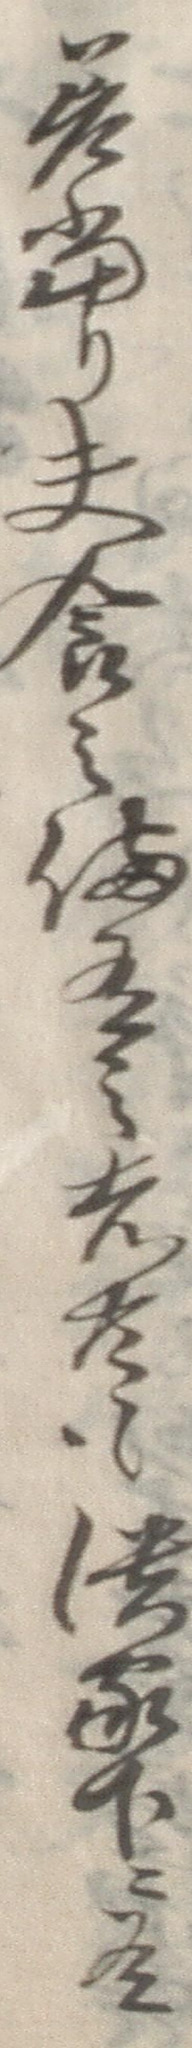差当り夫食之備有之者共も潰家下二有
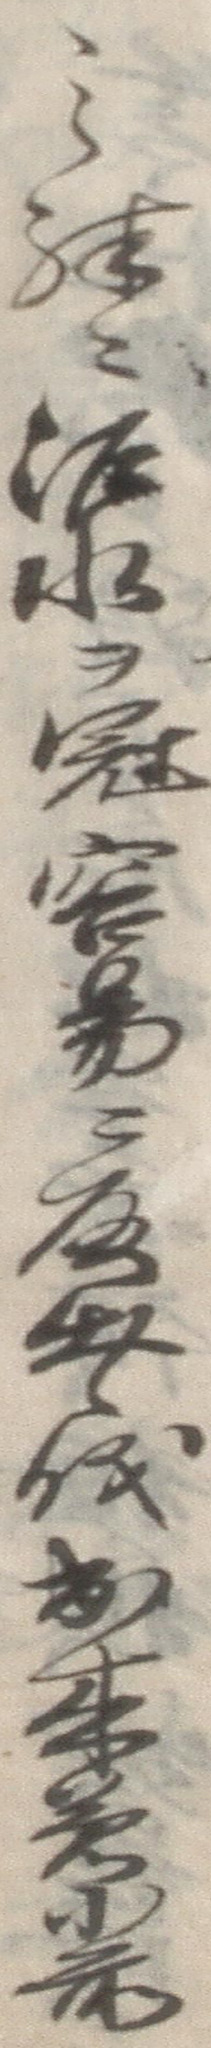之殊二泥水ヲ冠容易二取出候儀出来兼小前
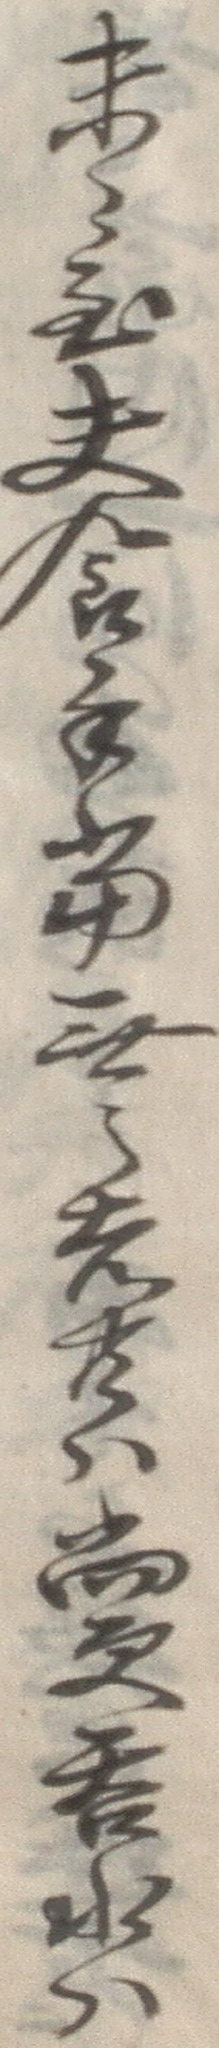末々至夫食手当無之者共ハ尚更呑水ハ
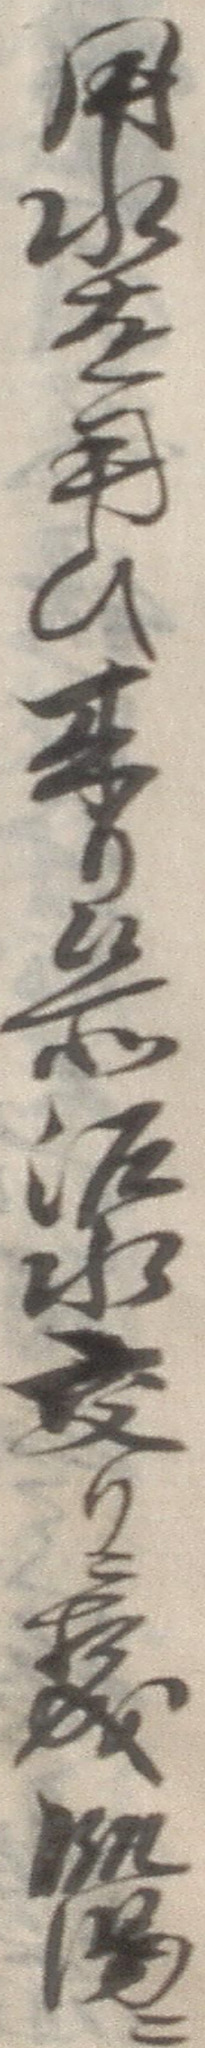用水を用ひ来り候所泥水交り二相成飢渇二
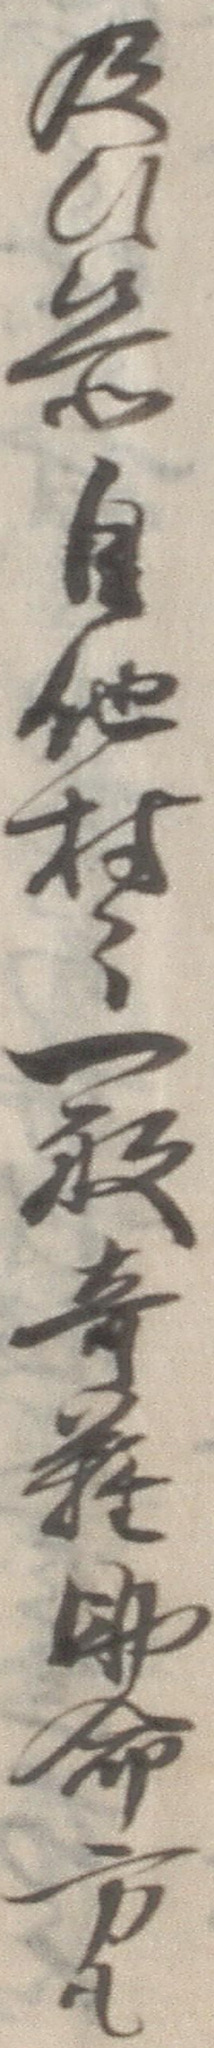及び候所自他村々一致奇難助命方も
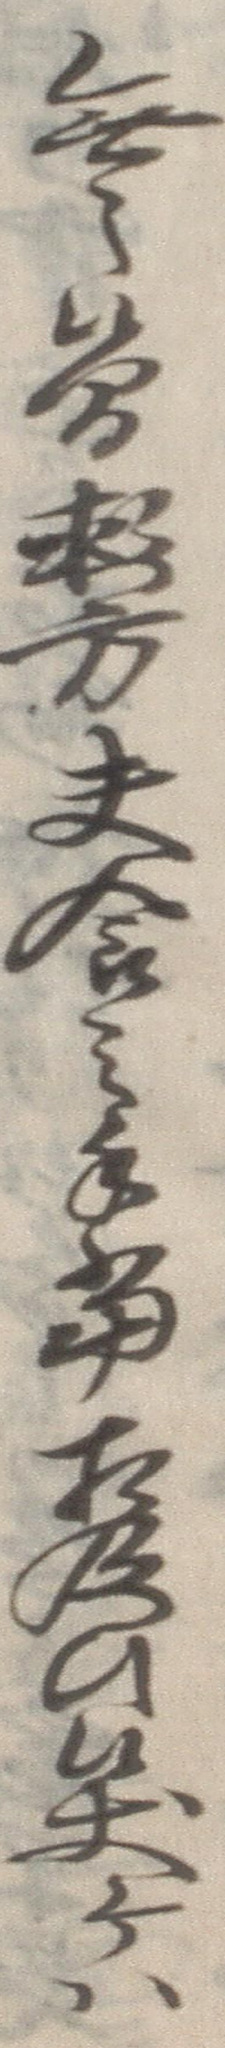無之候間頼方夫食之手当相及ひ候丈ヶハ
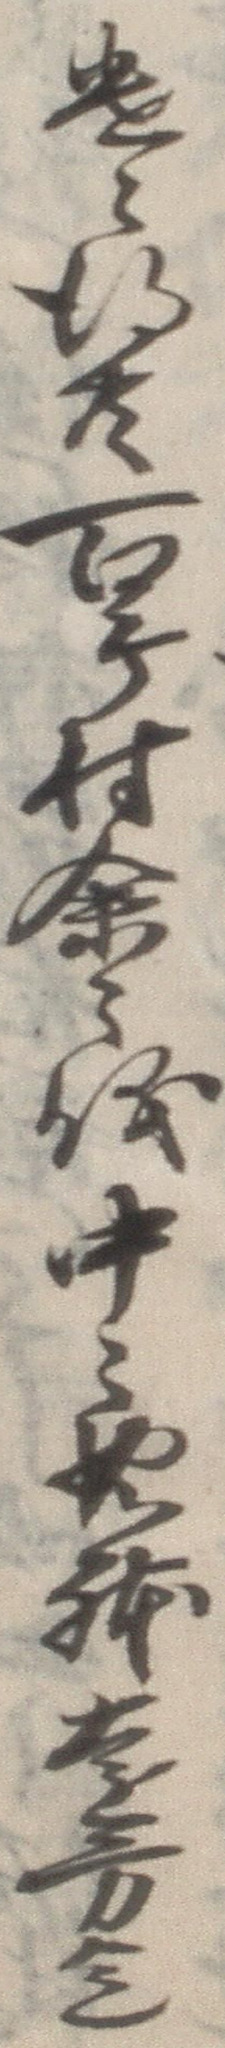遣候得共百ヶ村余之儀中々惣体遠方迄
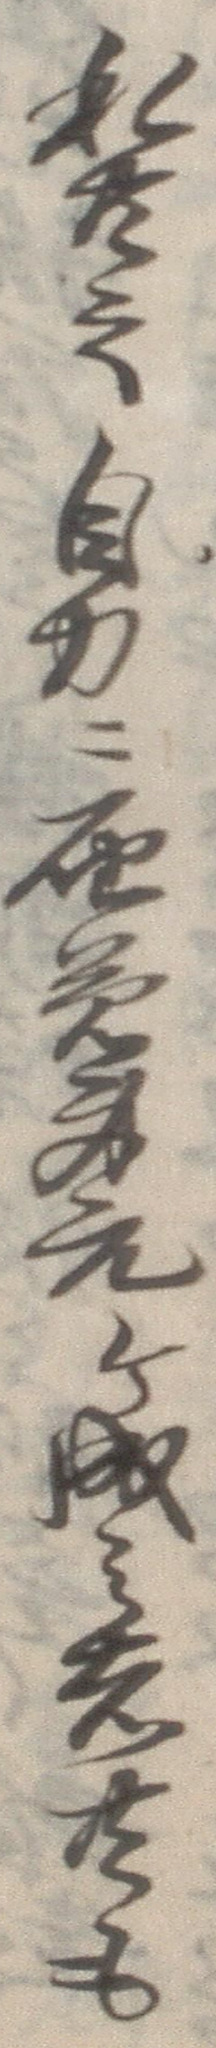私共之自力二届兼身元ヶ成之者共も
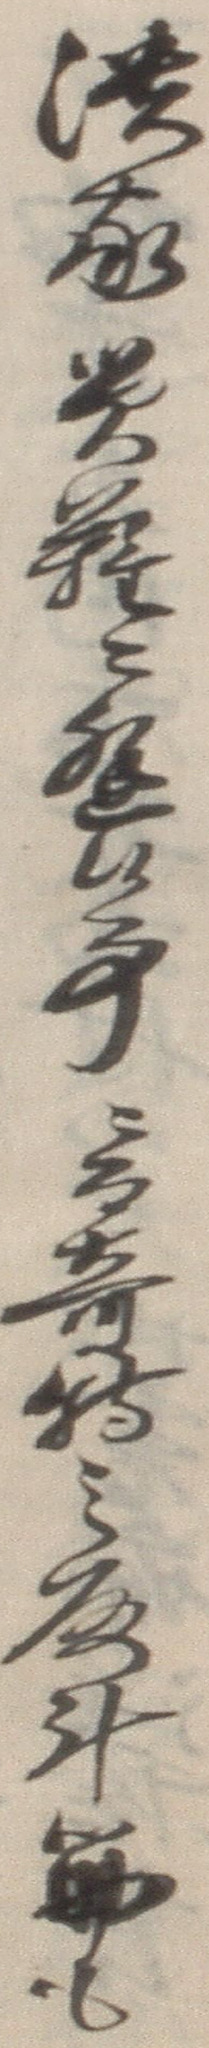潰家災難逢候事二而奇特之取計筋も
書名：信州地震一件
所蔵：東京大学地震研究所図書室 Earthquake Research Institute Library, The University of Tokyo, JAPAN
